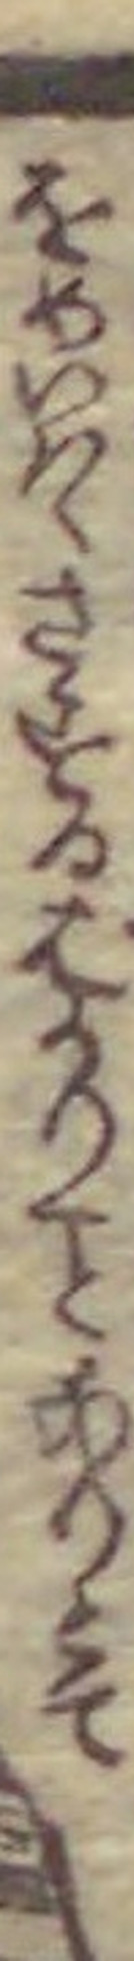をめいはくさするはかりことありとて
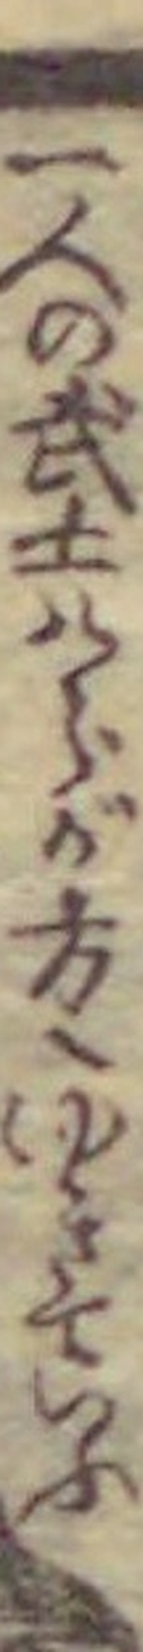一人の武士八郎が方へゆきていふ
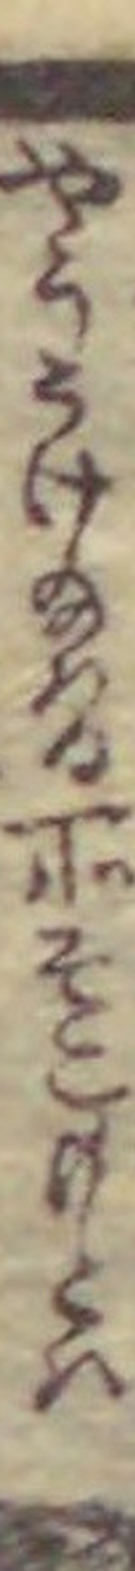やううけ給はる所そこもとは
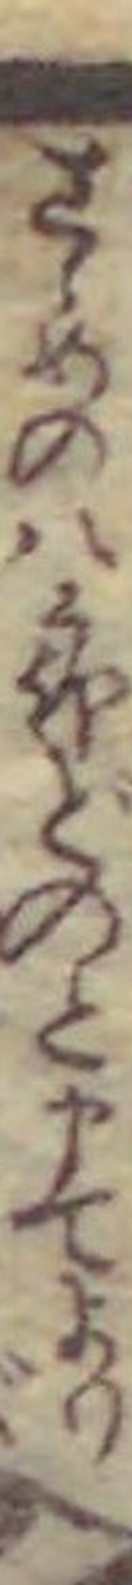さゝめの八郎どのと申てより
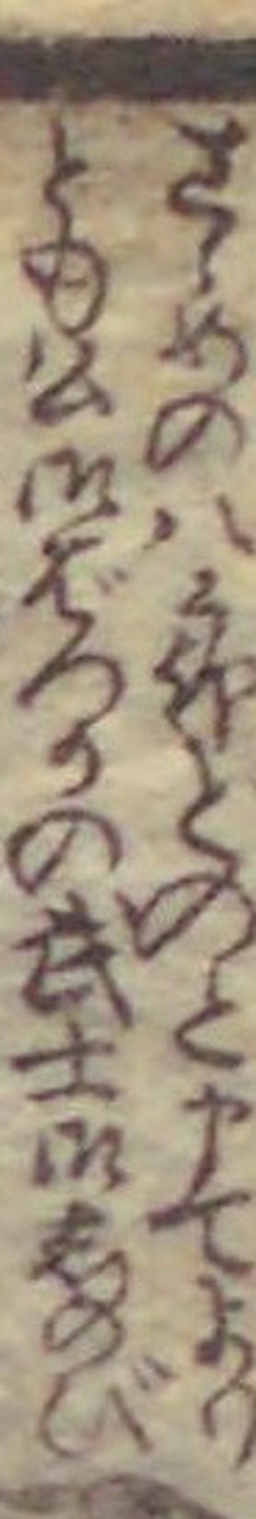とも公御ばつかの武士御しのび
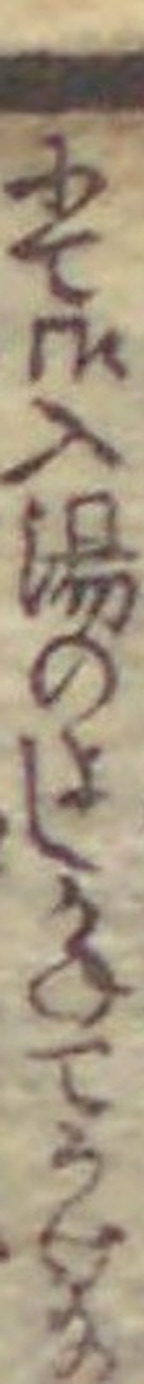にて御入湯のよしかねてうけ給
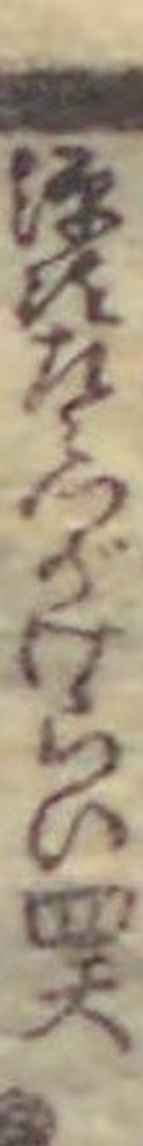源次左衛門がけらい四天
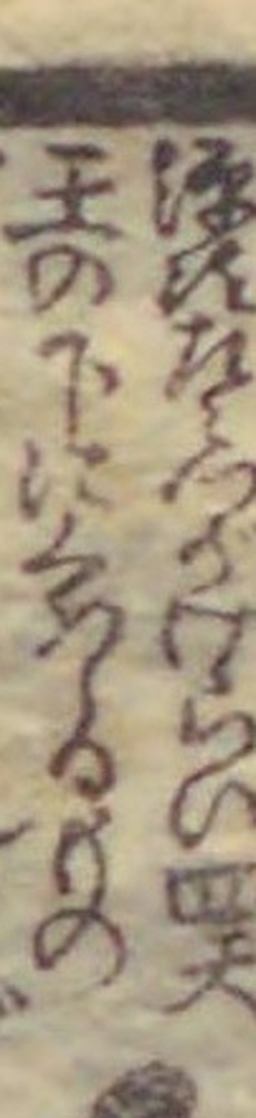王の下にくはゝるもの
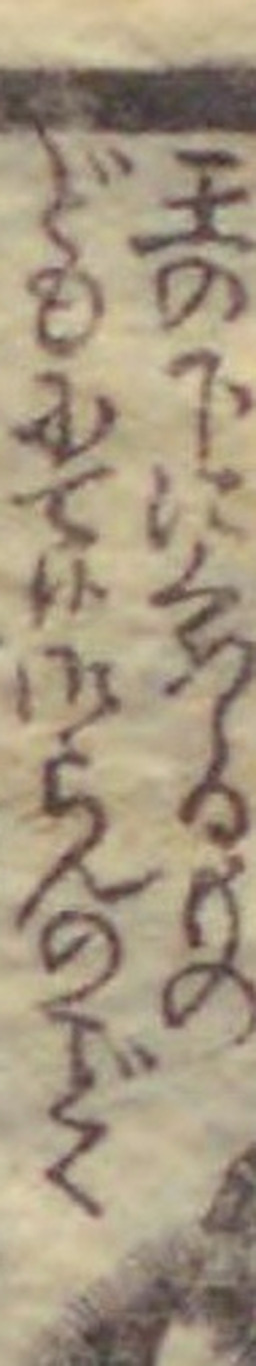どもにて候御らんのごとく
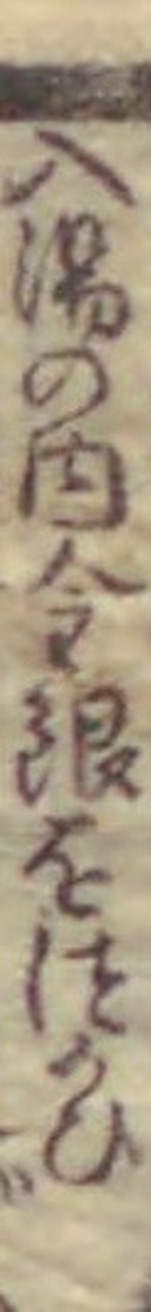入湯の内金銀をつかひ
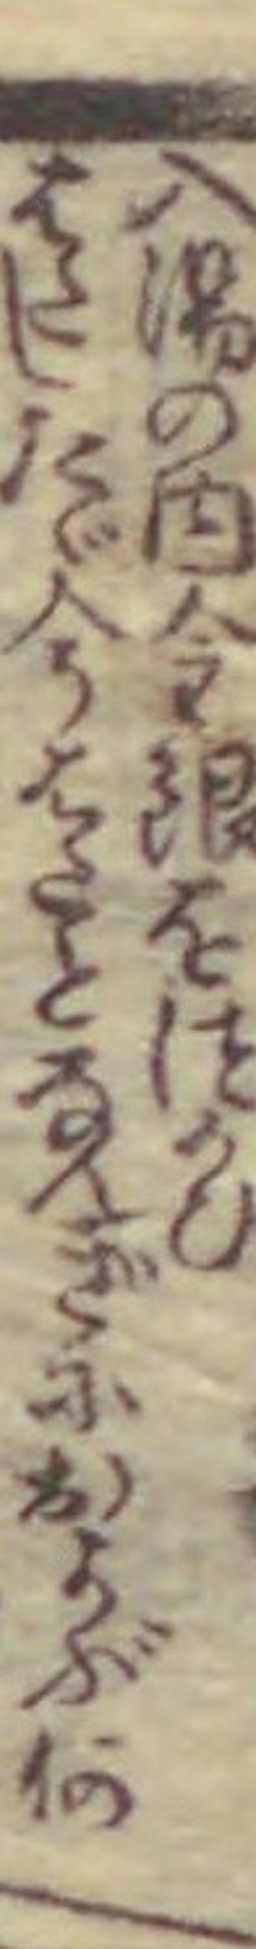はたしたゞ今はたとなんぎにおよぶ何
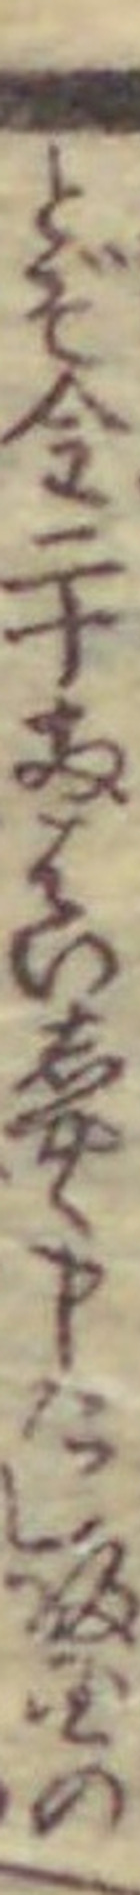とぞ金二十両はいしやく申たし帰国の
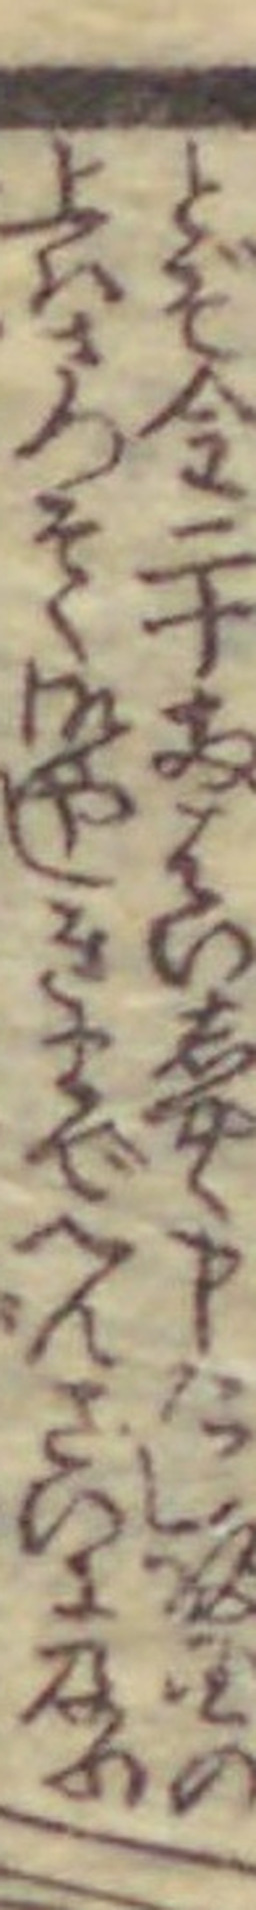上はさつそく御やしきまでへんさいに及ふ
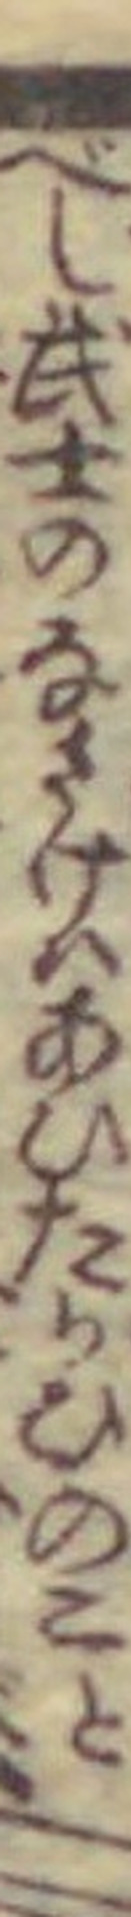べし武士のなさけはあひたがひのこと
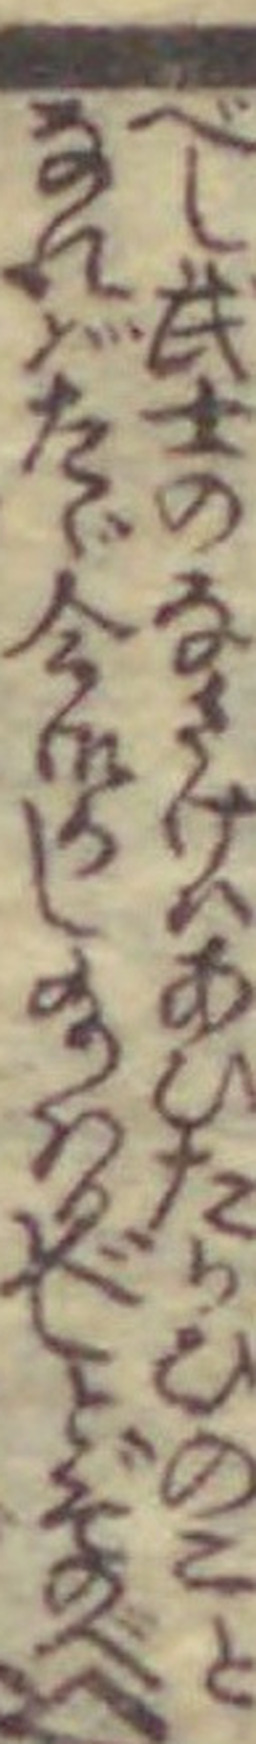なればたゞ今御かし給はるべしとぞのべ
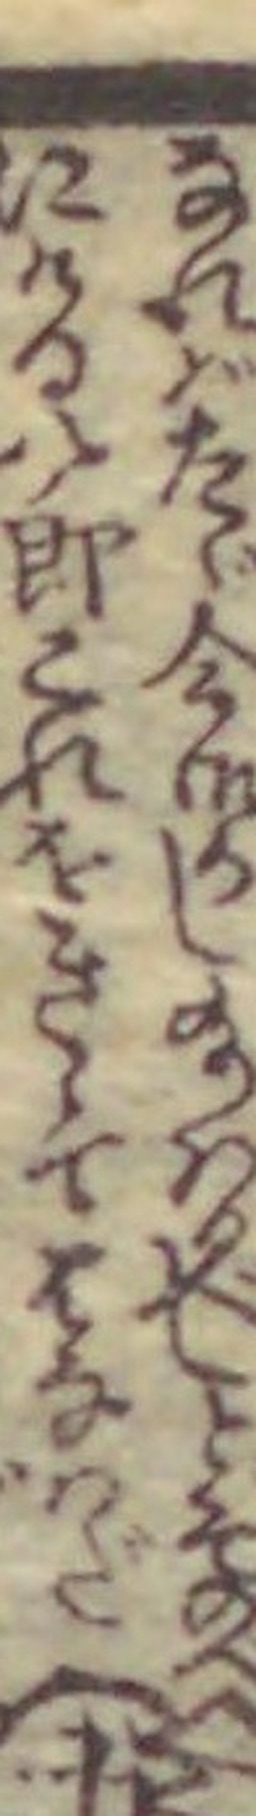にける八郎これをきゝてはなはだ
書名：八ツ目鱣因縁物語 3巻
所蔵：国立国会図書館 National Diet Library, JAPAN
